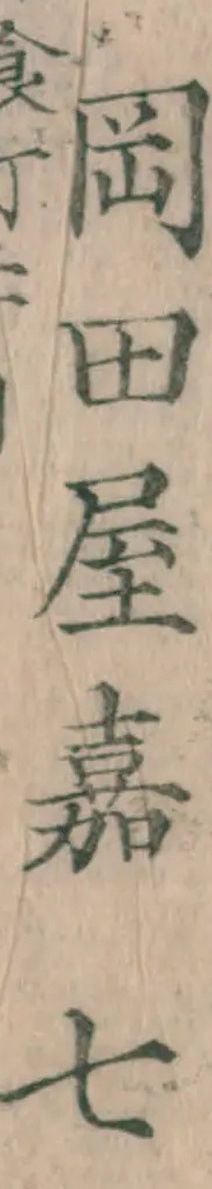岡田屋嘉七
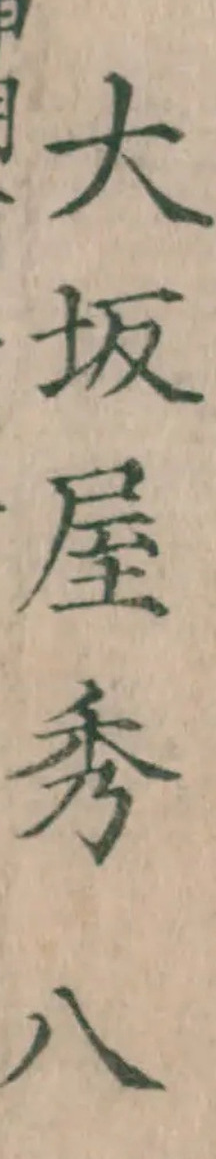大坂屋秀八
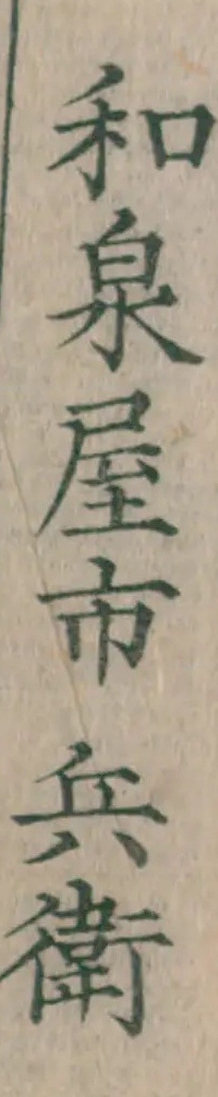和泉屋市兵衛
